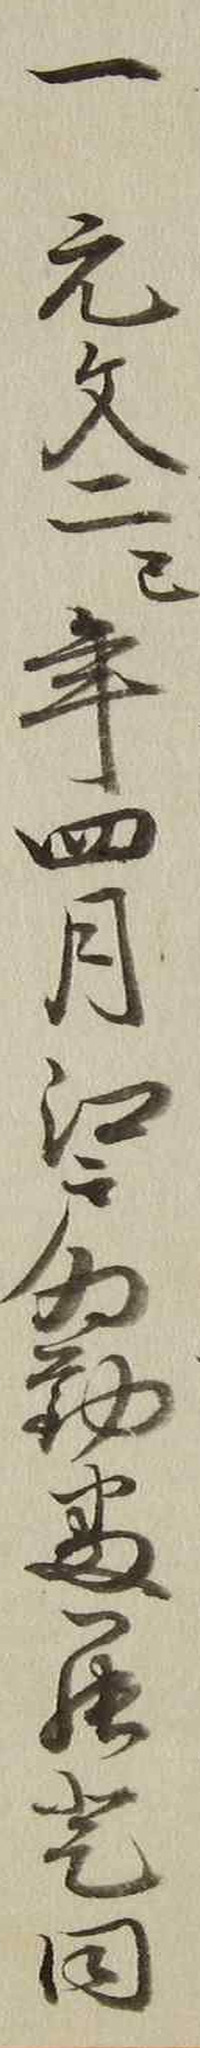一元文二巳年四月江戸為勤番罷登同
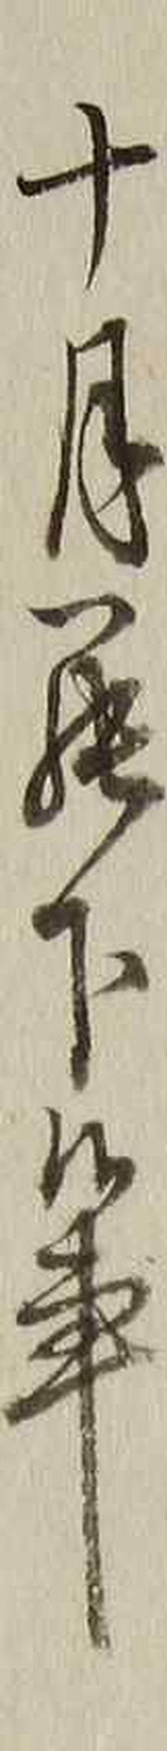十月罷下候事
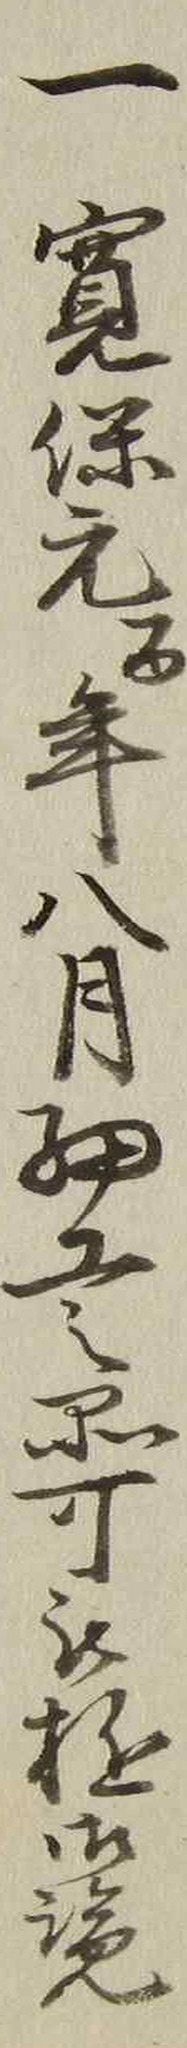一寛保元酉年八月細工之品可被遊御覧
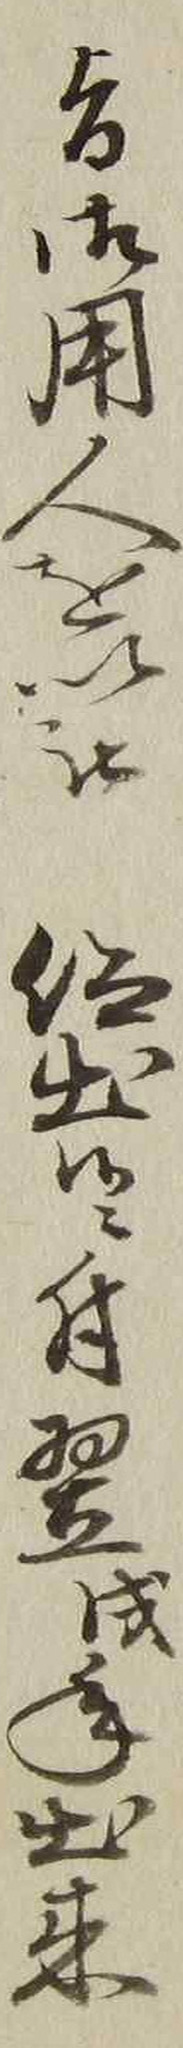旨御用人を以被仰出候ニ付翌戊年出来
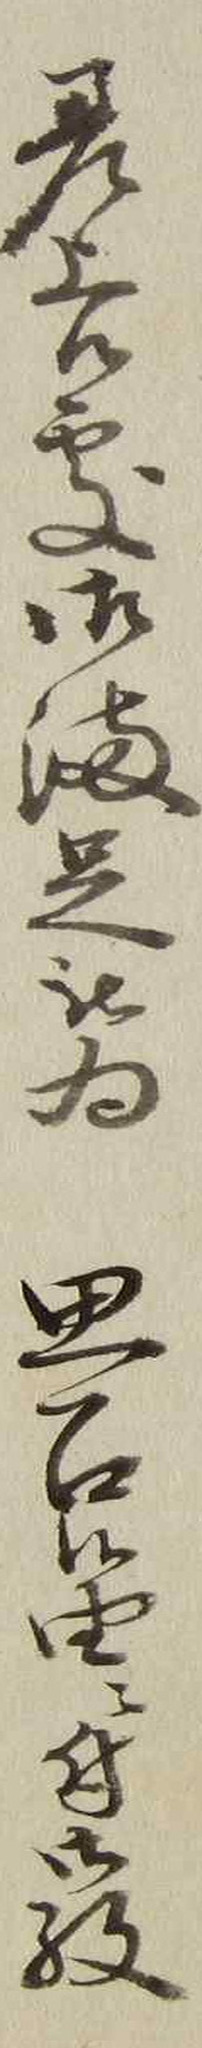差上候処御満足被為思召候由ニ付御紋
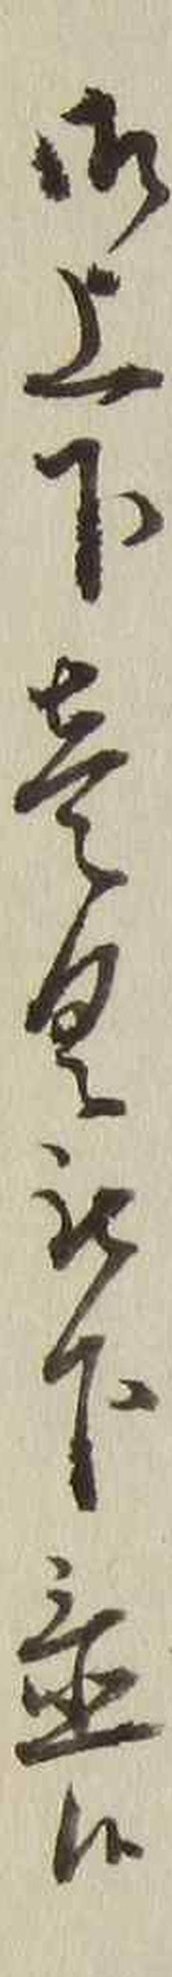御上下壱具被下置候
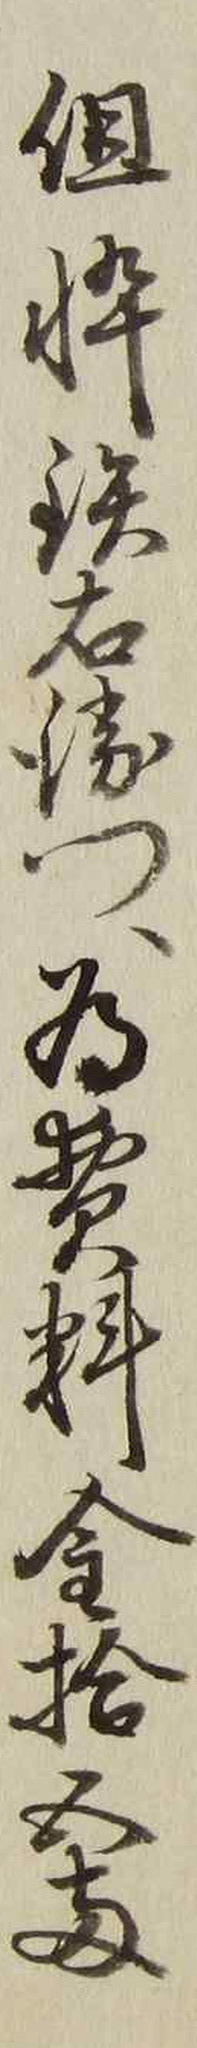但忰鉄右衛門へ為費料金拾五両
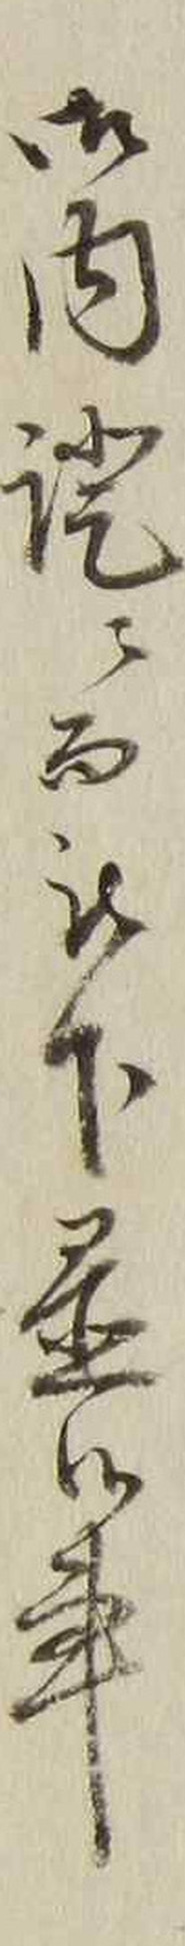御内証ニ而被下置候事

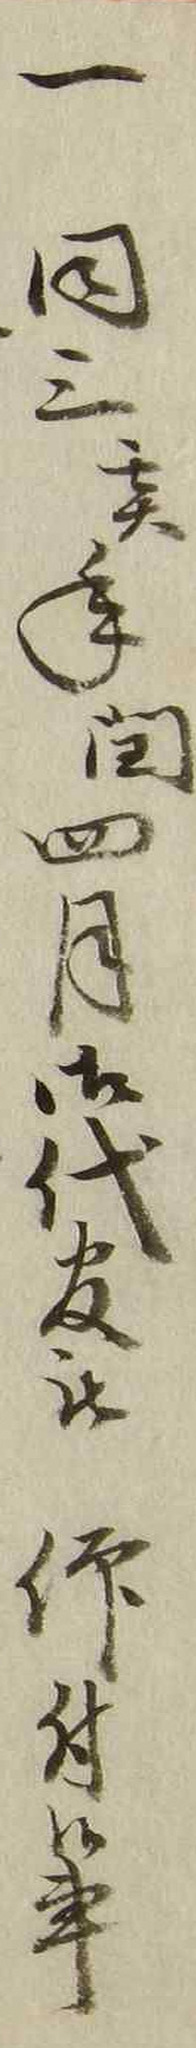一同三年亥年閏四月御代官被仰付候事
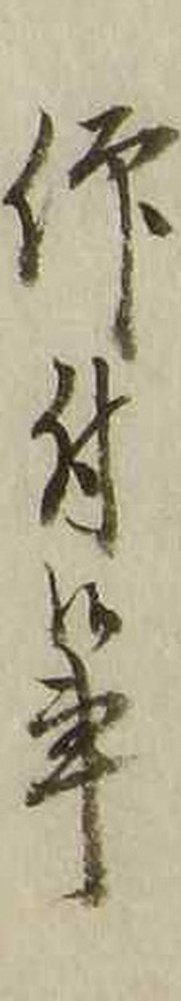仰付候事
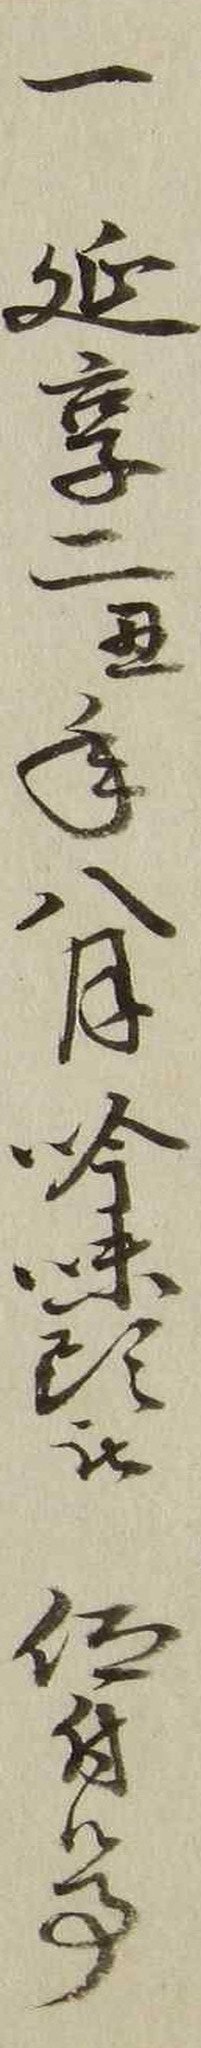一延享二丑年八月吟味頭被仰付候事
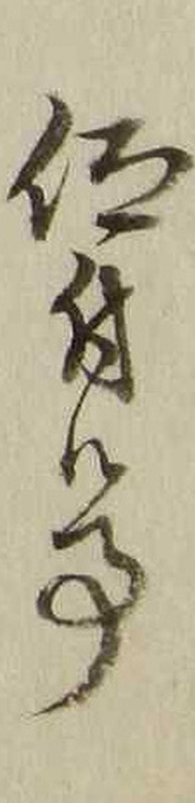仰付候事
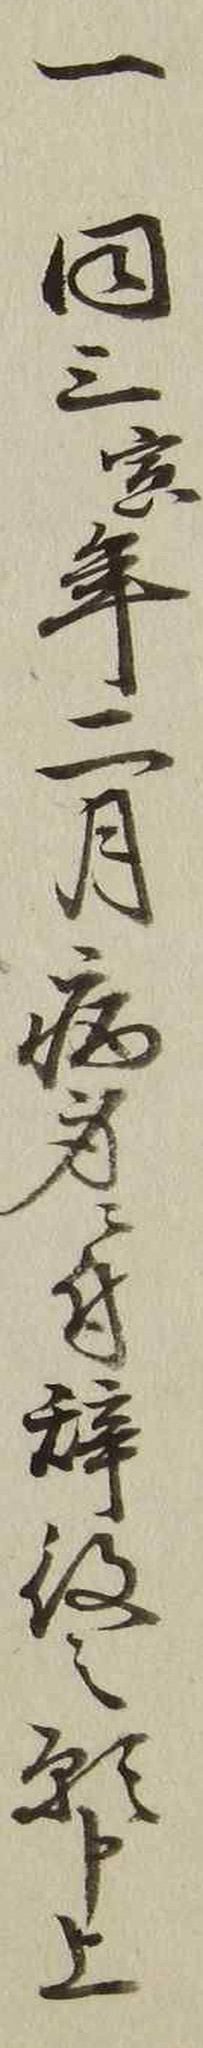一同三寅年二月病身ニ付辞役之願申上
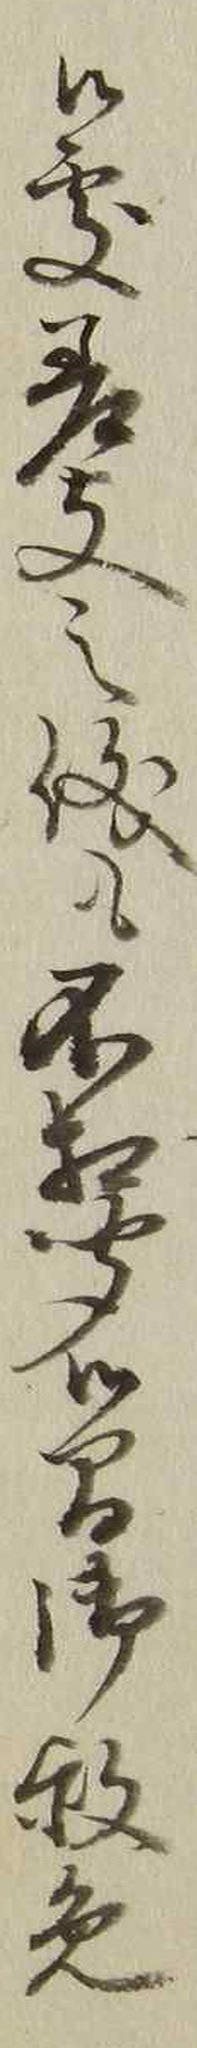候処差支之儀も不相聞候間御赦免
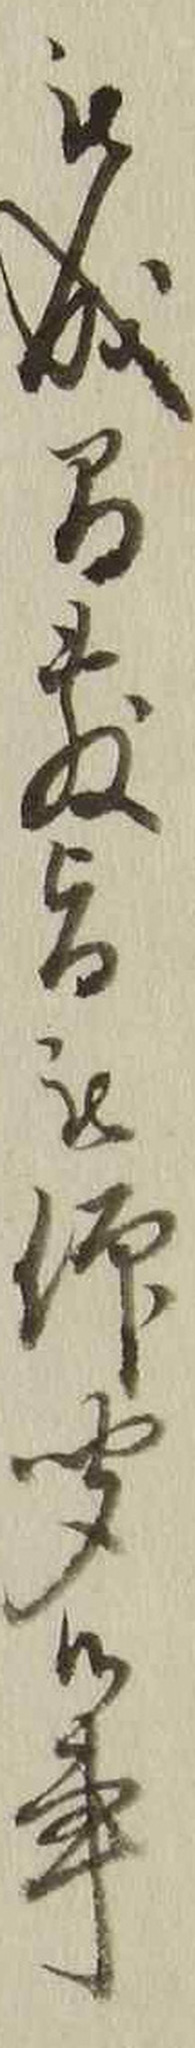被成間敷旨被仰聞候事
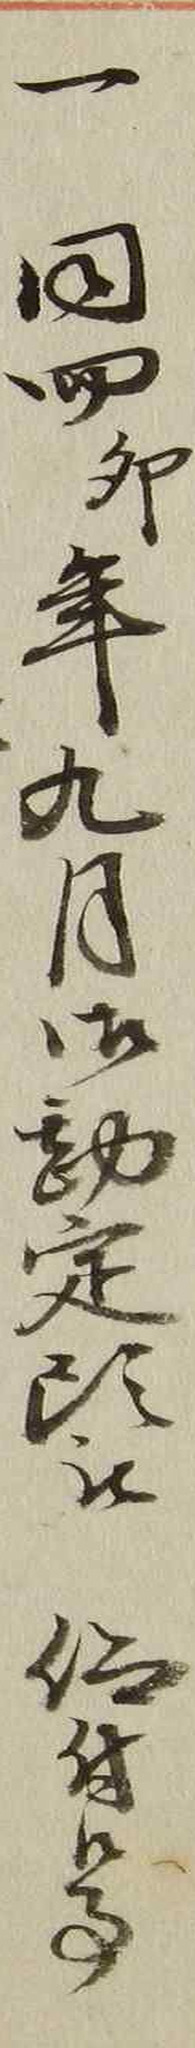一同四卯年九月御勘定頭被仰付候事
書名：諸士系譜　巻之27　い之部27
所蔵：会津若松市立会津図書館
